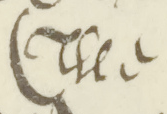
Elle
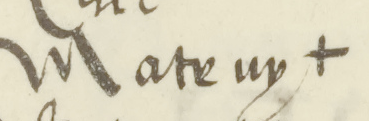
Matruyt
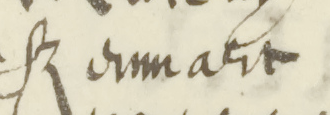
Keinnaert
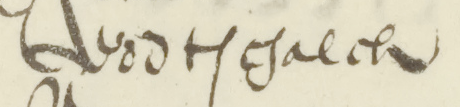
Godtschalk
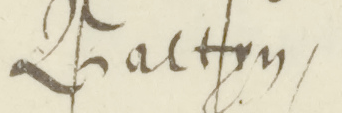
Baltyn
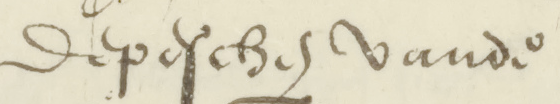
depeschen vande
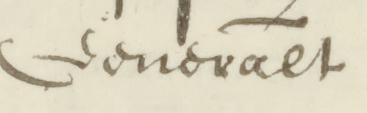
Generalt
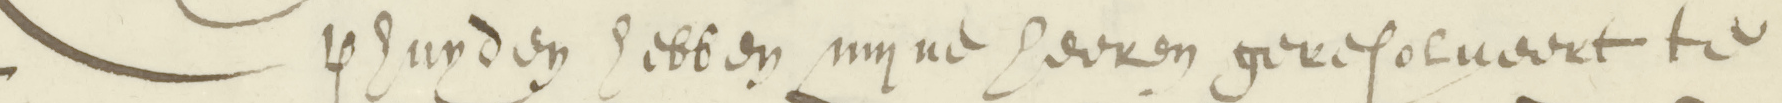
Op huyden hebben myne heeren geresolueert te
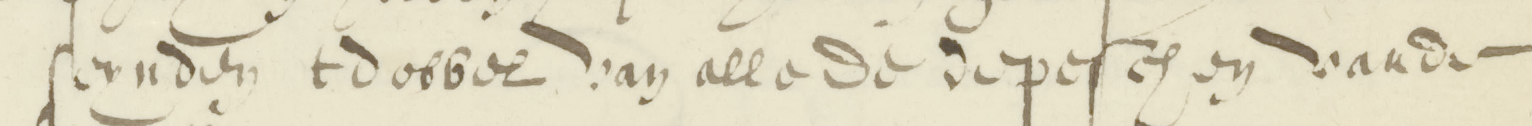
zeynden t dobbel van alle de depeschen vande
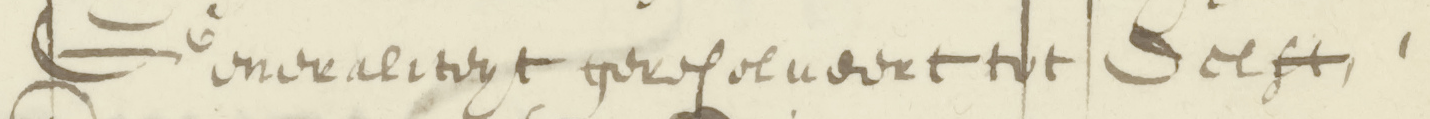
Generaliteyt geresolveert tot Delft,
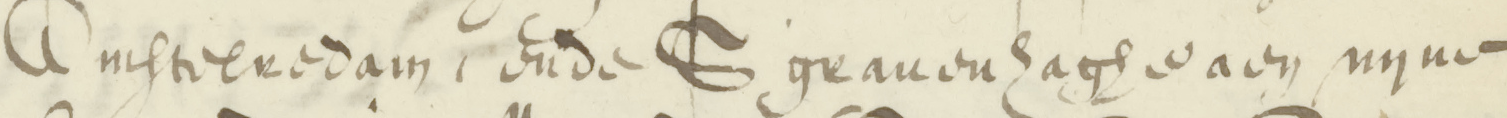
Amstelredam, ende S' gravenhaghe aen myne
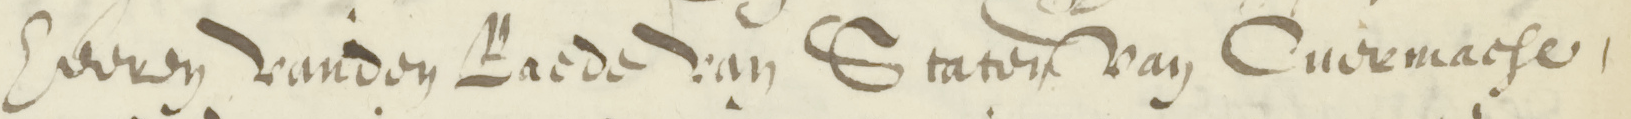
heeren vanden Raede van Staten van Overmaese,
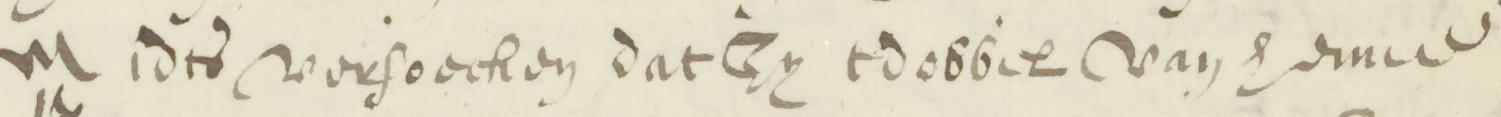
midts versoecken dat zy t'dobbel van heure
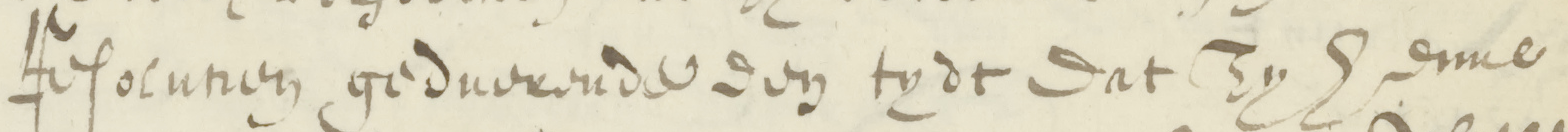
resolutien geduerende den tydt dat zy heure
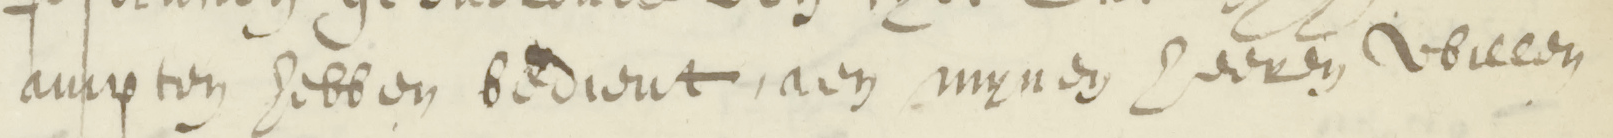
ampten hebben bedient, aen mynen heeren willen
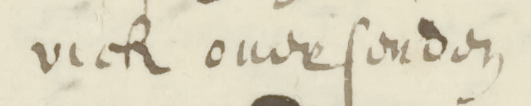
oick oversenden
